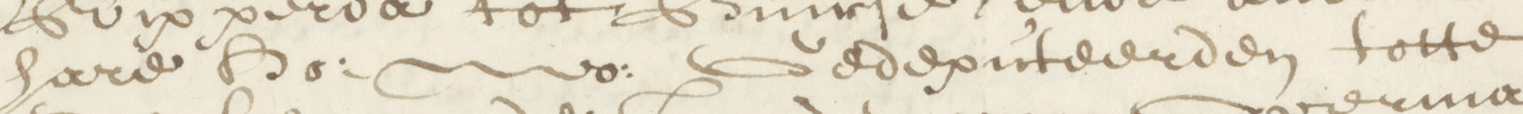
haere Ho:Mo: Gedeputeerden totte
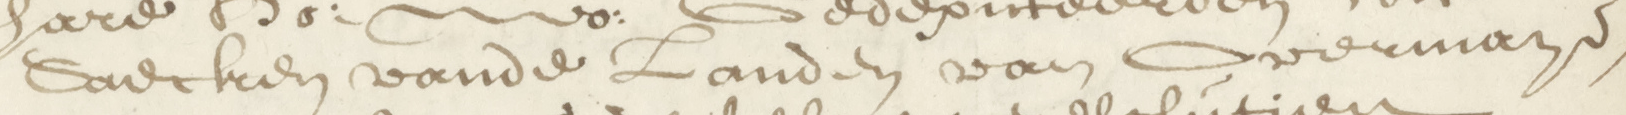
Saecken vande Landen van Overmaze,
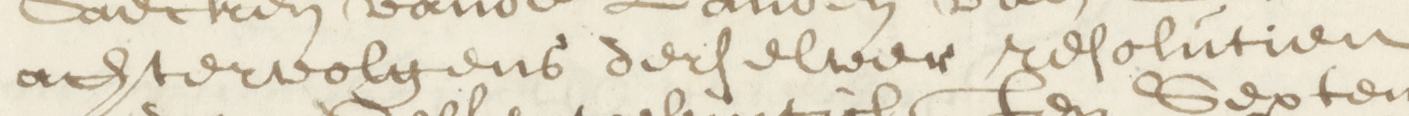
achtervolgens derselver resolutien
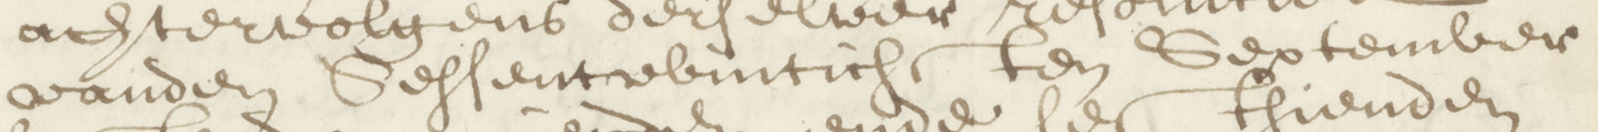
vanden Sessentwintichsten September
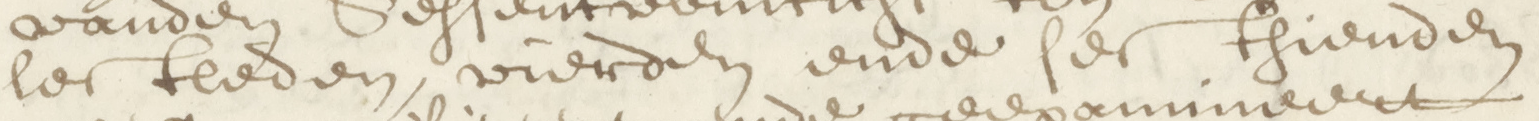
lestleden, vierden ende sesthienden
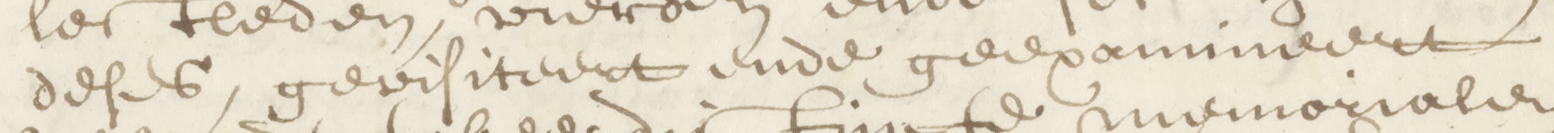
deses, gevisiteert ende geexamineert
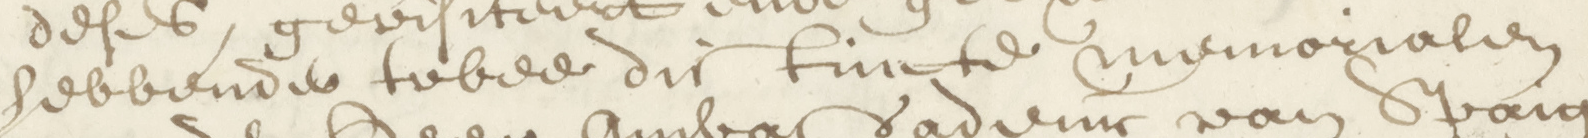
hebbende twee distincte memorialen
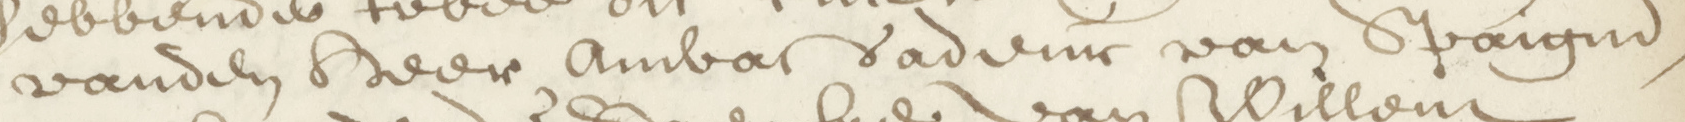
vanden Heer Ambassadeur van Spaigne,
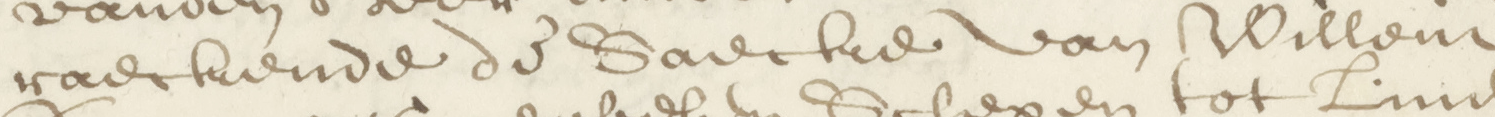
raeckende de Saecke van Willem
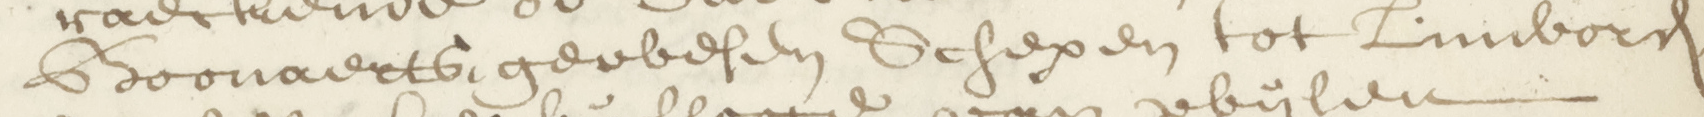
Boonaerts, gewesen Schepen tot Limborch
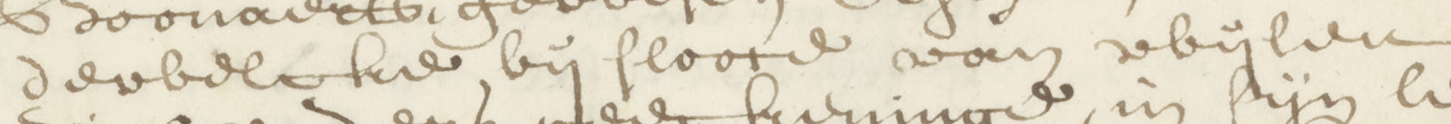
dewelcke bij sloote van wijlen
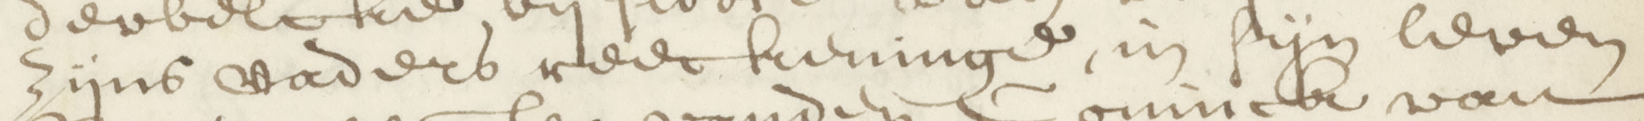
zijns vaders reeckeninge, in zijn leven
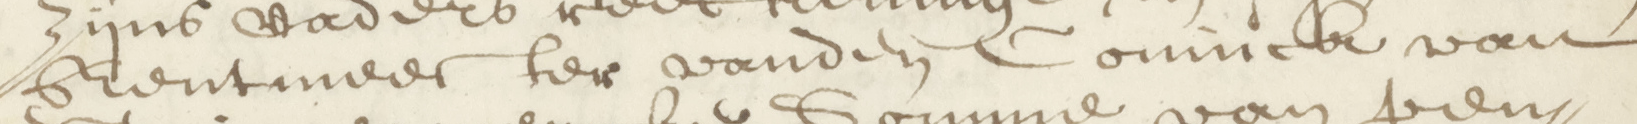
Rentmeester vanden Coninck van
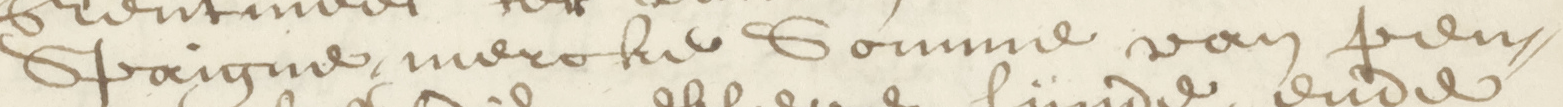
Spaigne, mercke somme van pen„
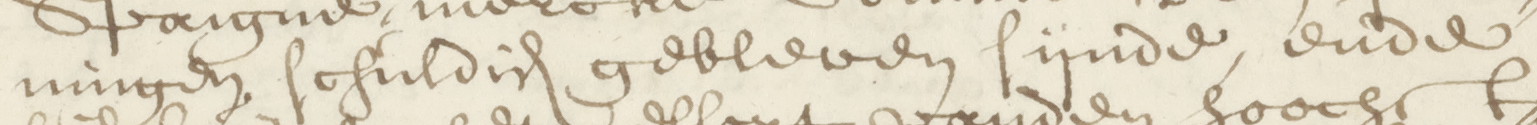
ningen schuldich gebleven sijnde, ende
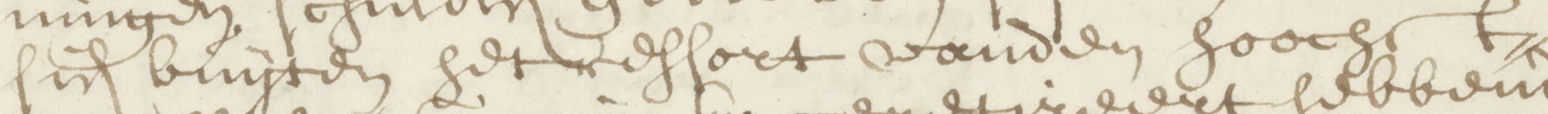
sich buijten het ressort vanden hoochst
